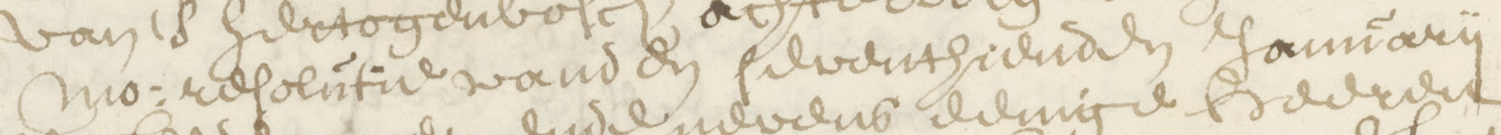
Mo: resolutie vanden seventhienden Januarij
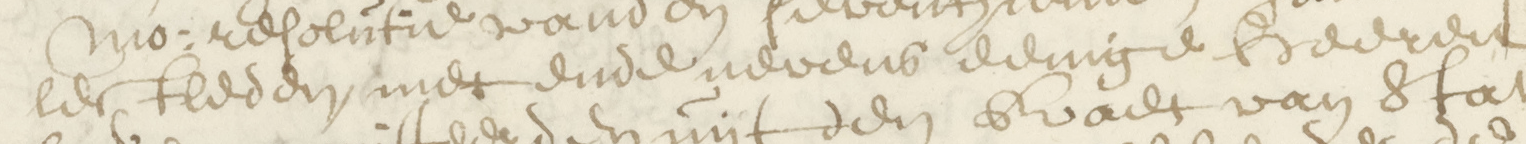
lestleden, met ende nevens eenige Heeren
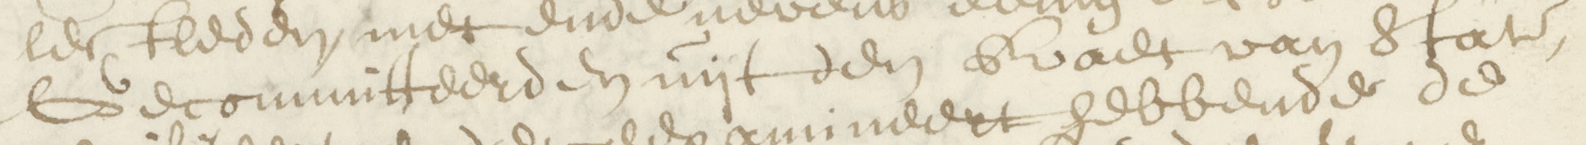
Gecommitteerden uijt den Raet van State,
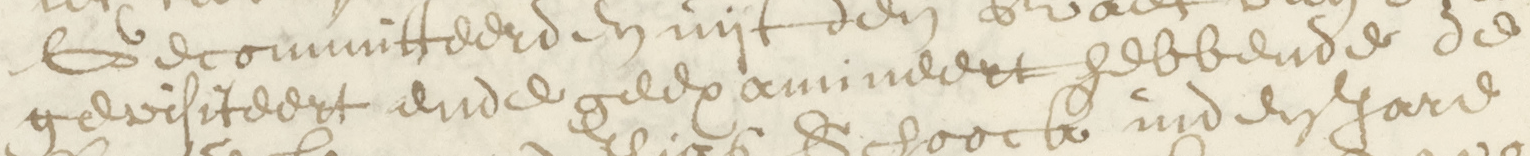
gevisiteert ende geexamineert hebbende de
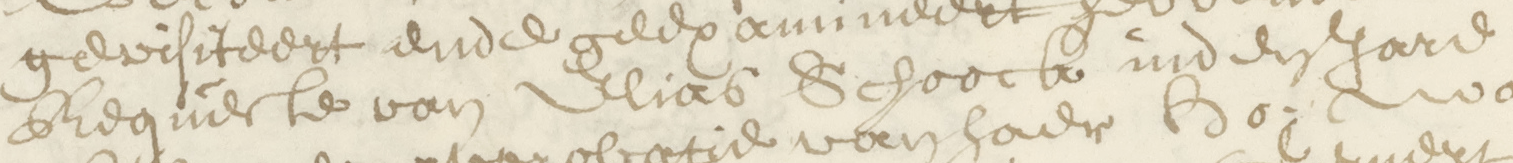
Requeste van Elias Schoock inden Jare
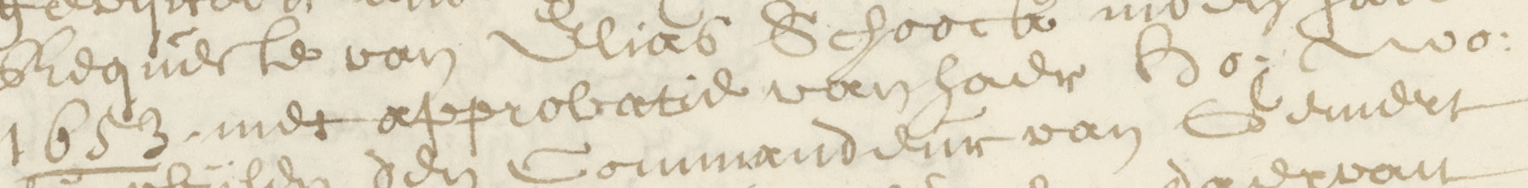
1653 met approbatie van haer Ho:Mo:
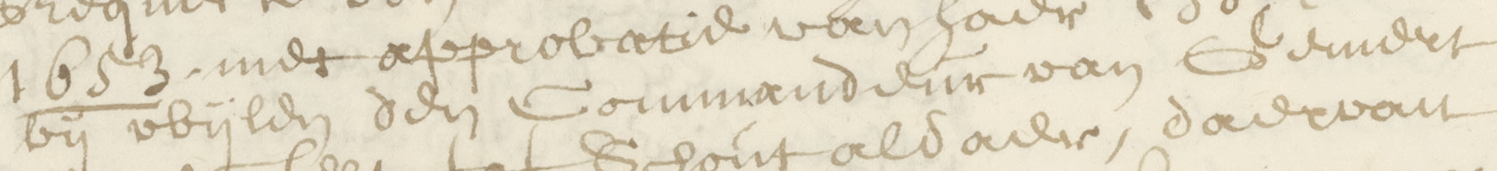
bij wijlen den Commandeur van Gemert
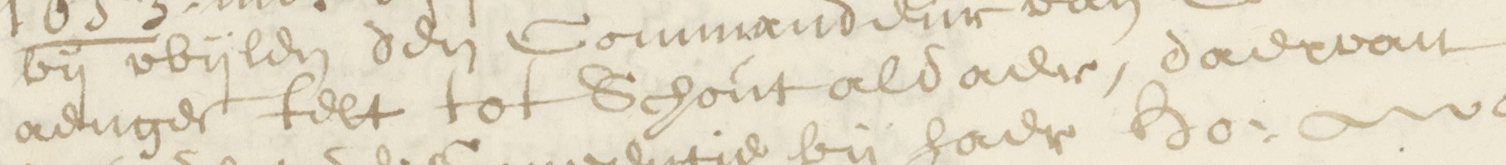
aengestelt tot Schout aldaer, daervan
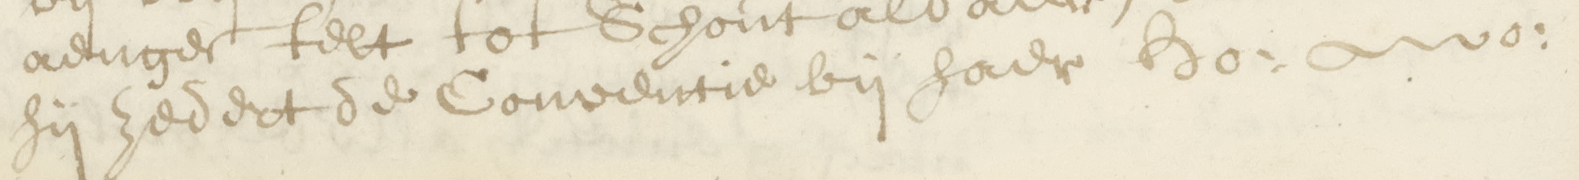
hij zedert de Conventie bij haer Ho:Mo:
